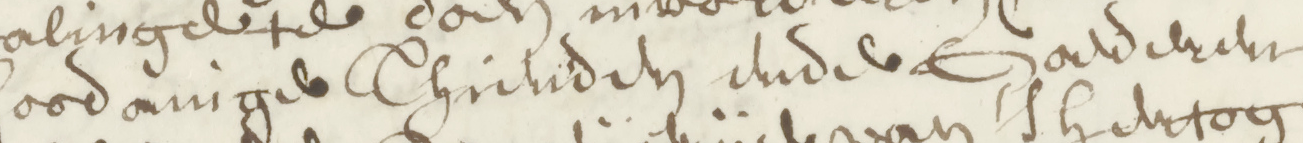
soodanige Thienden ende Goederen
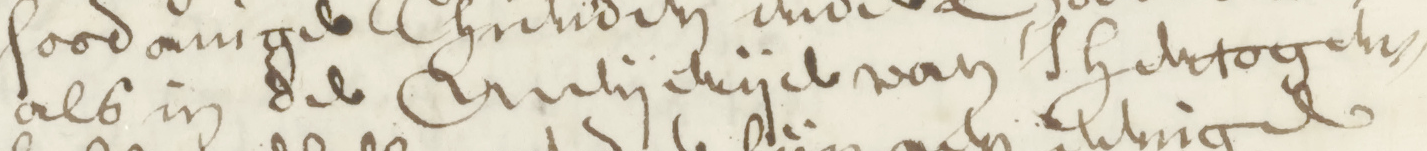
als in de Meijerije van ‛s hertogen„
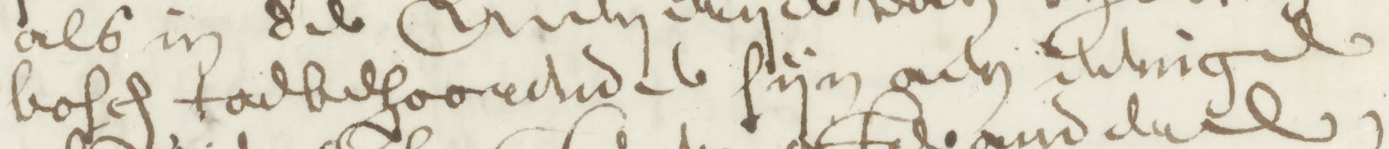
bosch toebehoorende sijn aen eenige
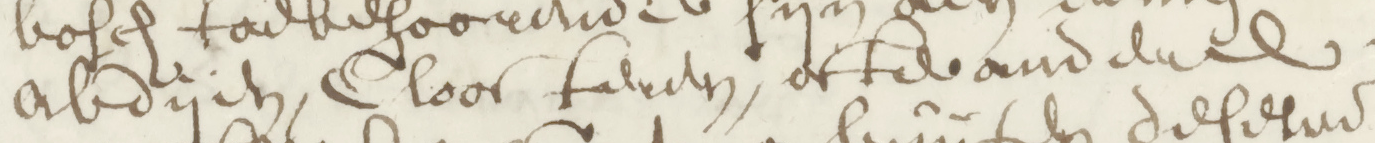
Abdijen, Cloosteren, ofte andere
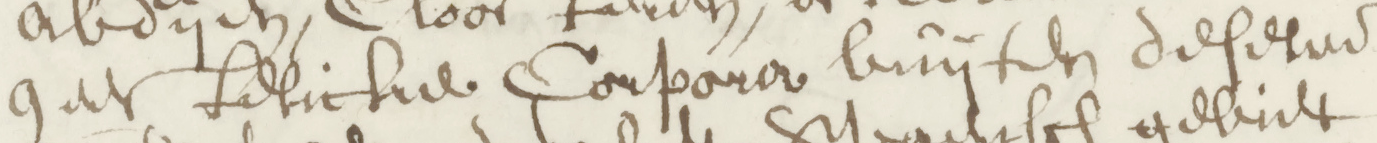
geestelicke Corpora buijten deselve
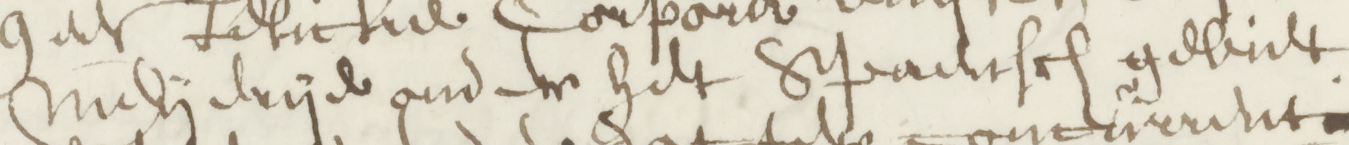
Meijerije onder het Spaensch gebiet
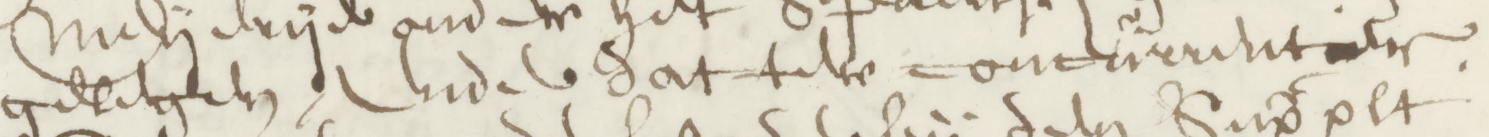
gelegen, Ende dat ter concurrentier
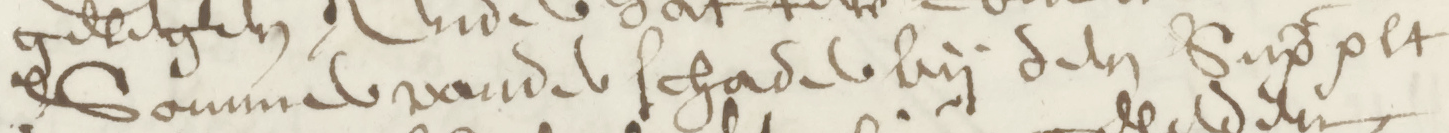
Somme vande schade bij den Supplt.
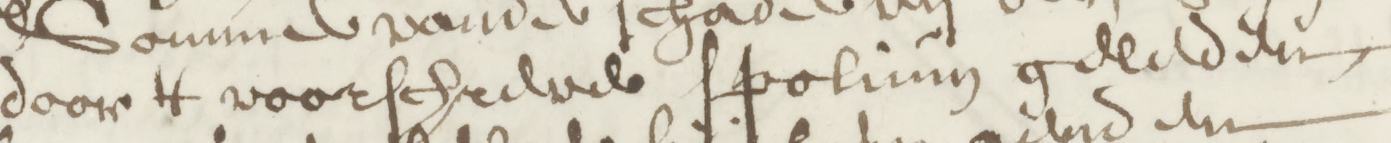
door 't voorschreve spolium geleden,
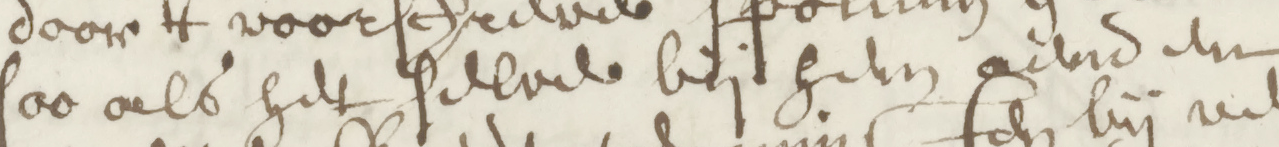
soo als het selve bij hem aenden
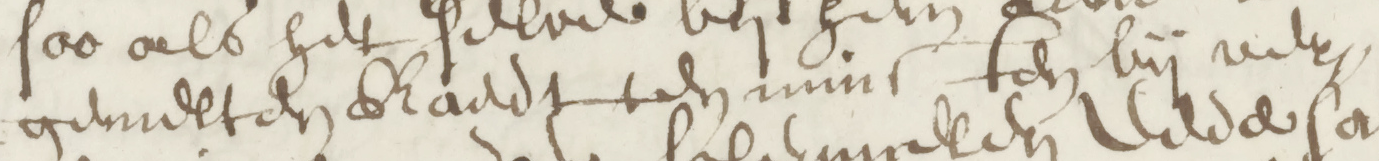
gemelten Raedt ten minsten bij ver„
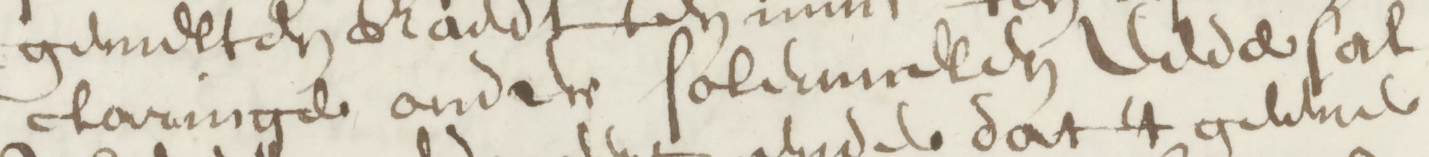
claringe onder solemnelen Eede sal
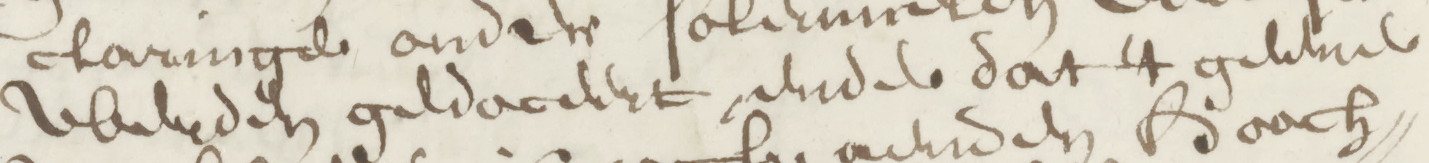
werden gedoceert, ende dat 't geene
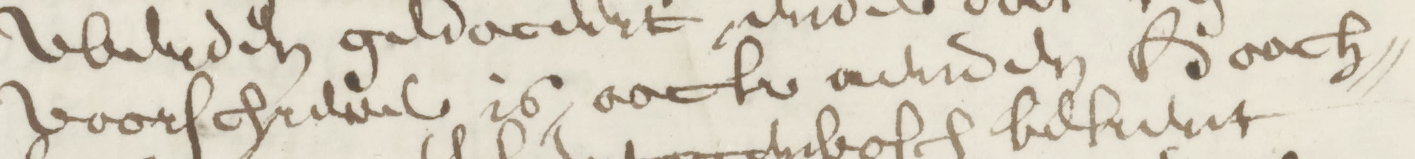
voorschreve is, oock aenden Hooch„
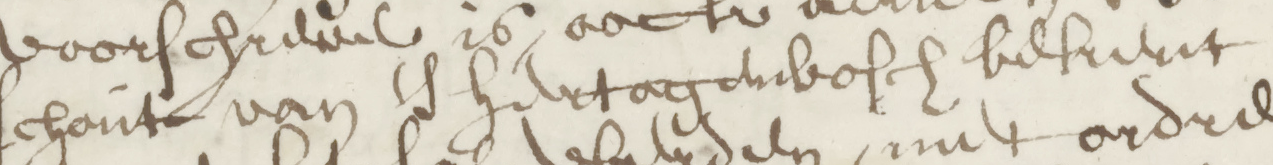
schout van ‛s hertogenbosch bekent
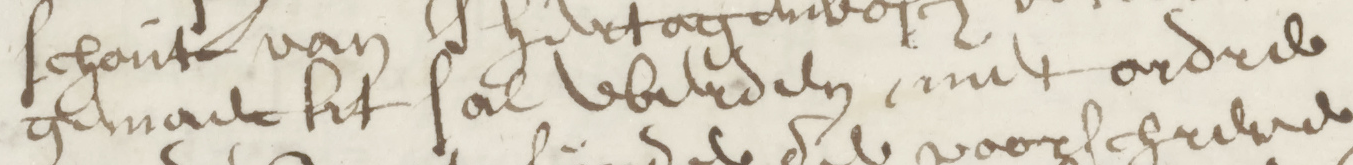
gemaeckt sal werden, met ordre
